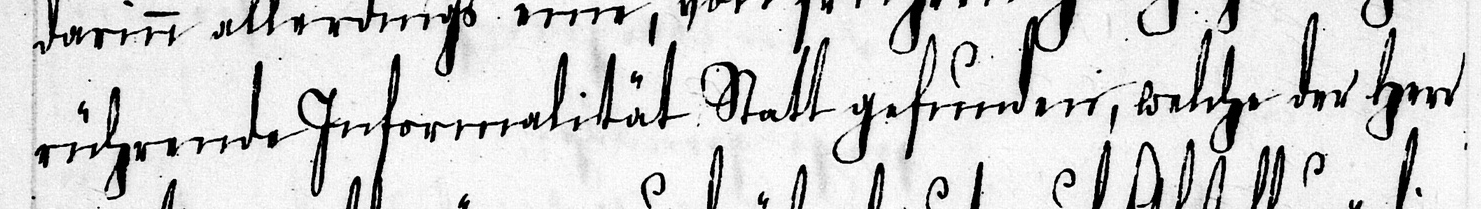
rührende Informalität Statt gefunden, welche der Herr
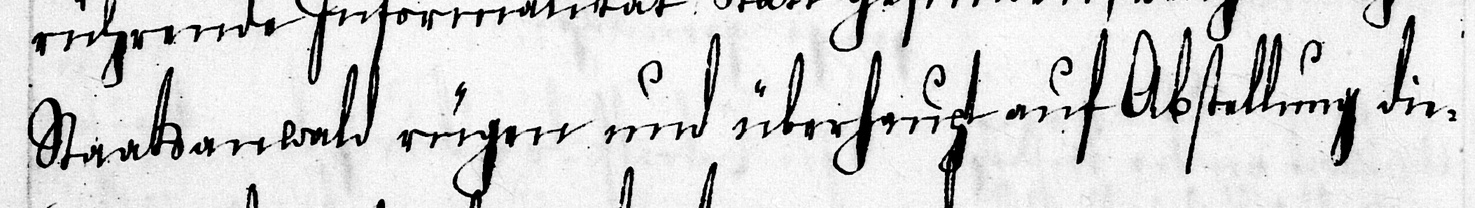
Staatsanwald rügen und überhaupt auf Abstellung di¬
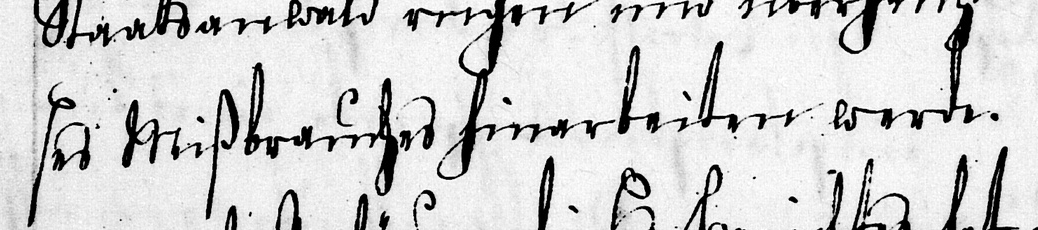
eses Mißbrauches hinarbeiten werde.
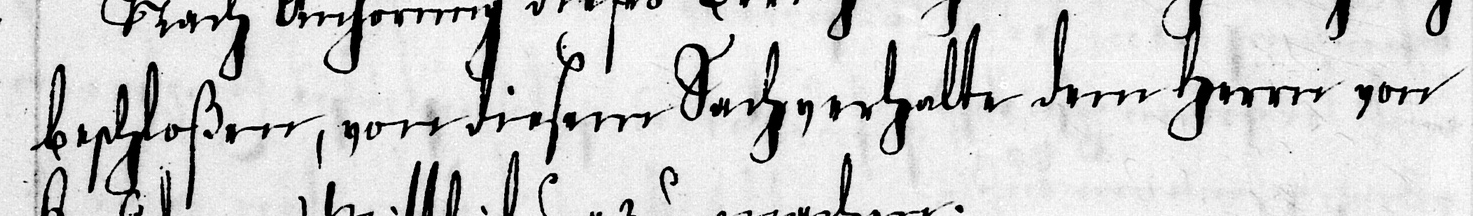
beschloßen, von diesem Sachverhalte dem Herrn von
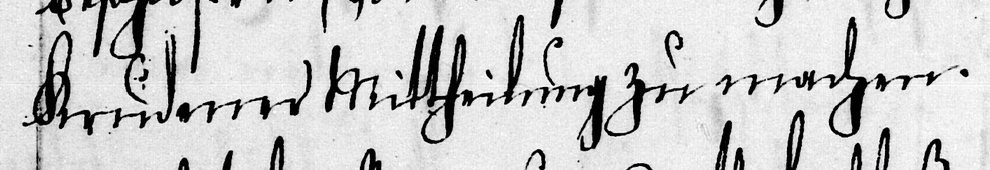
Krudener Mittheilung zu machen.
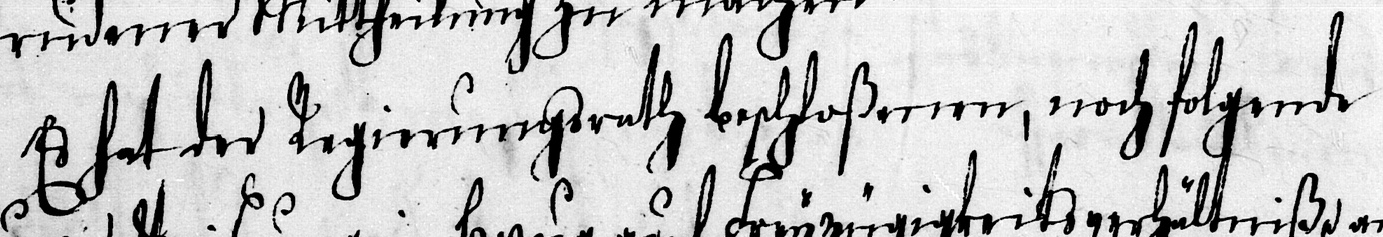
Es hat der Regierungsrath beschloßen, noch folgende
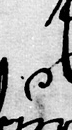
st¬
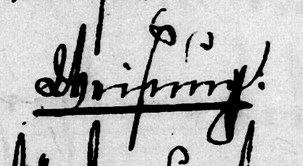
Weisung:
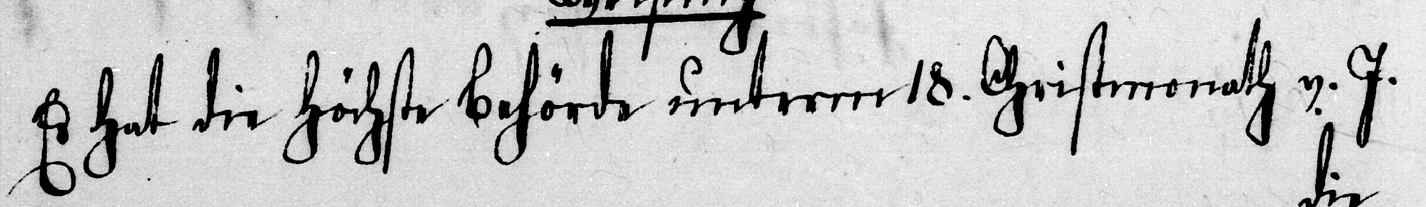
Es hat die Höchste Behörde unterm 18. Christmonath v. J.
